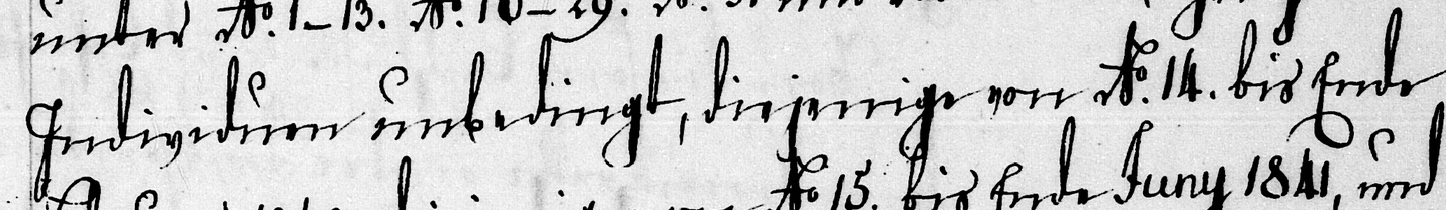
Individuen unbedingt, diejenige von No. 14. bis Ende
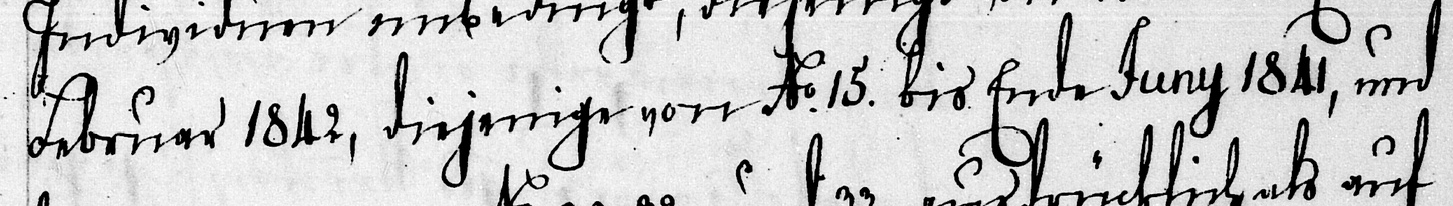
Februar 1842, diejenige von No. 15. bis Ende Juny 1841, und
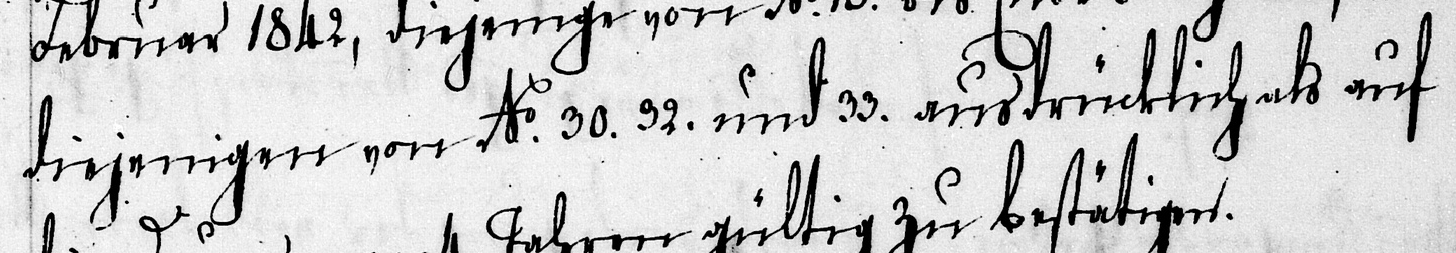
diejenigen von No. 30. 32. und 33. ausdrücklich als auf
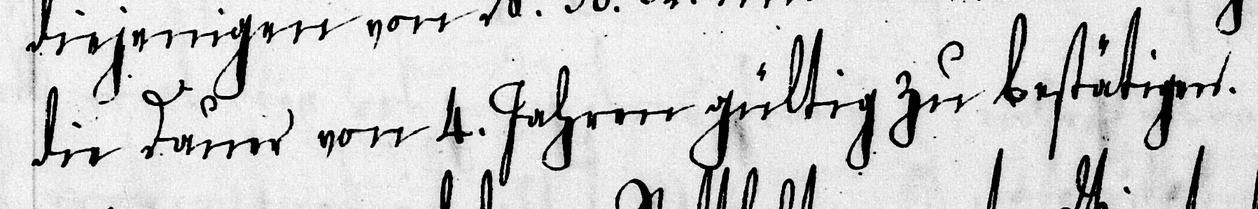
die Dauer von 4. Jahren gültig zu bestätigen.
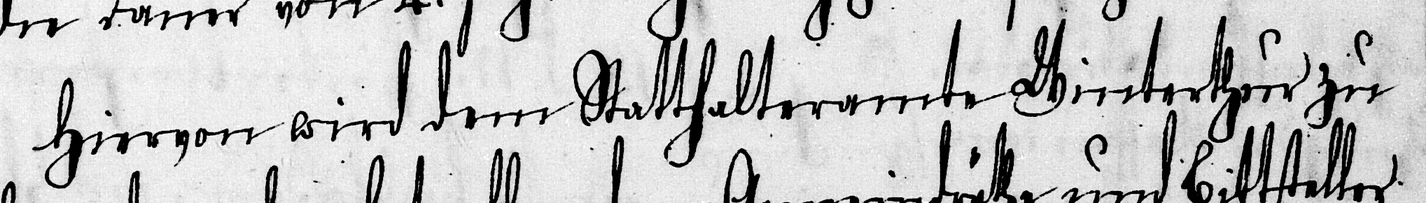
Hiervon wird dem Statthalteramte Winterthur zu
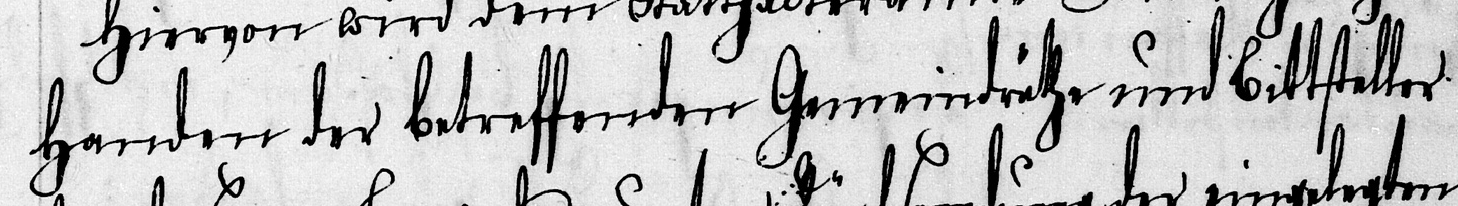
Handen der betreffenden Gemeindräthe und Bittstel¬
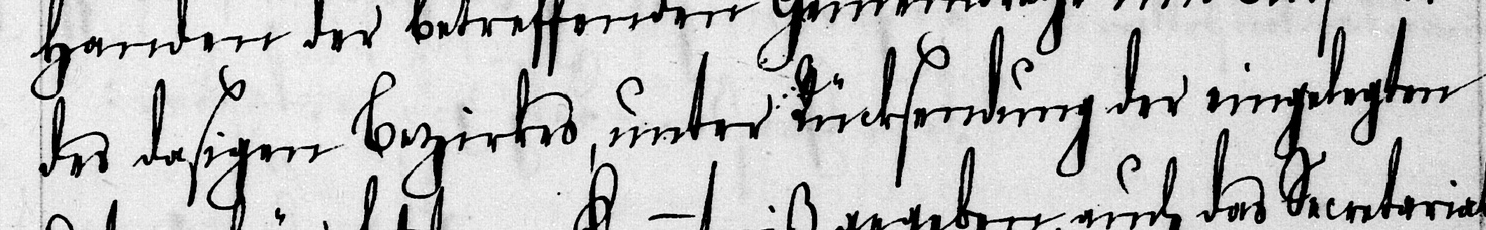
des dasigen Bezirkes, unter Rücksendung der eingelegten
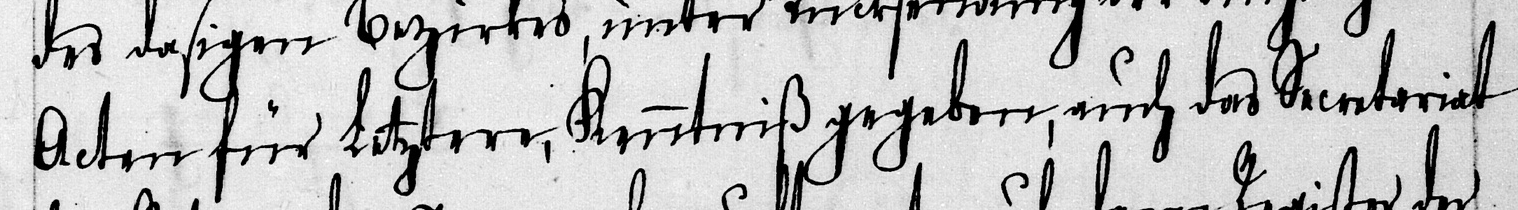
Acten für Letztere, Kenntniß gegeben, auch das Secretariat
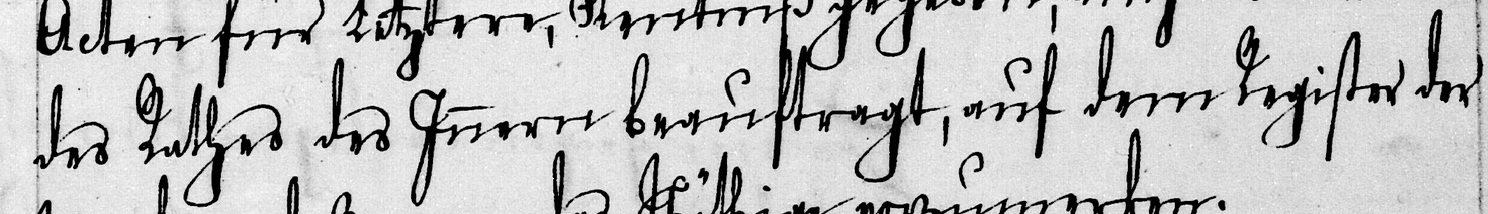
des Rathes des Innern beauftragt, auf dem Register der
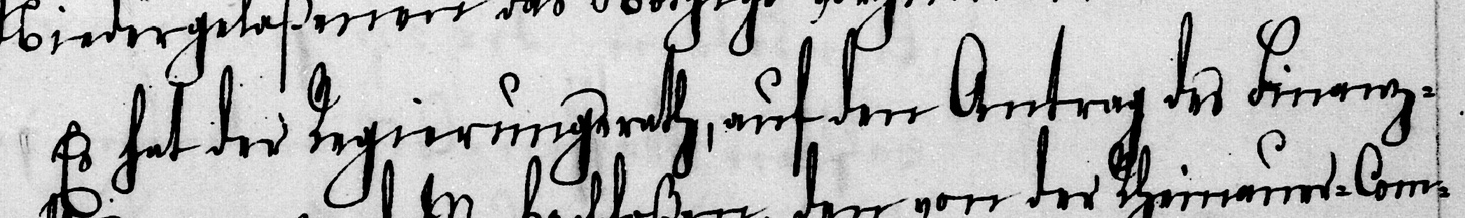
Es hat der Regierungsrath, auf den Antrag des Finanz¬
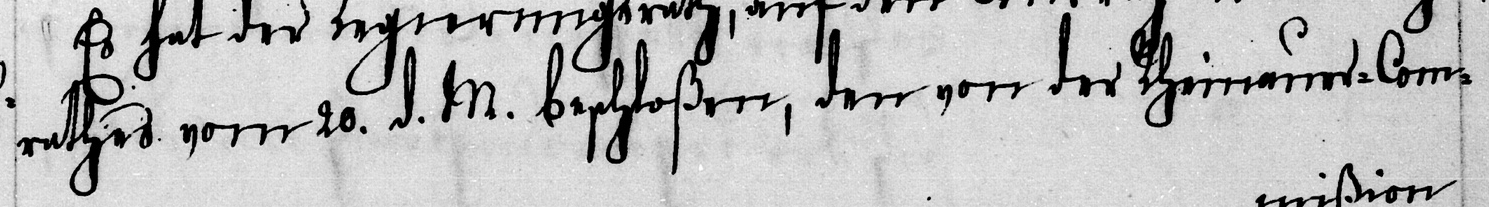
rathes vom 20. d. M. beschloßen, den von der Rheinauer-Com-
